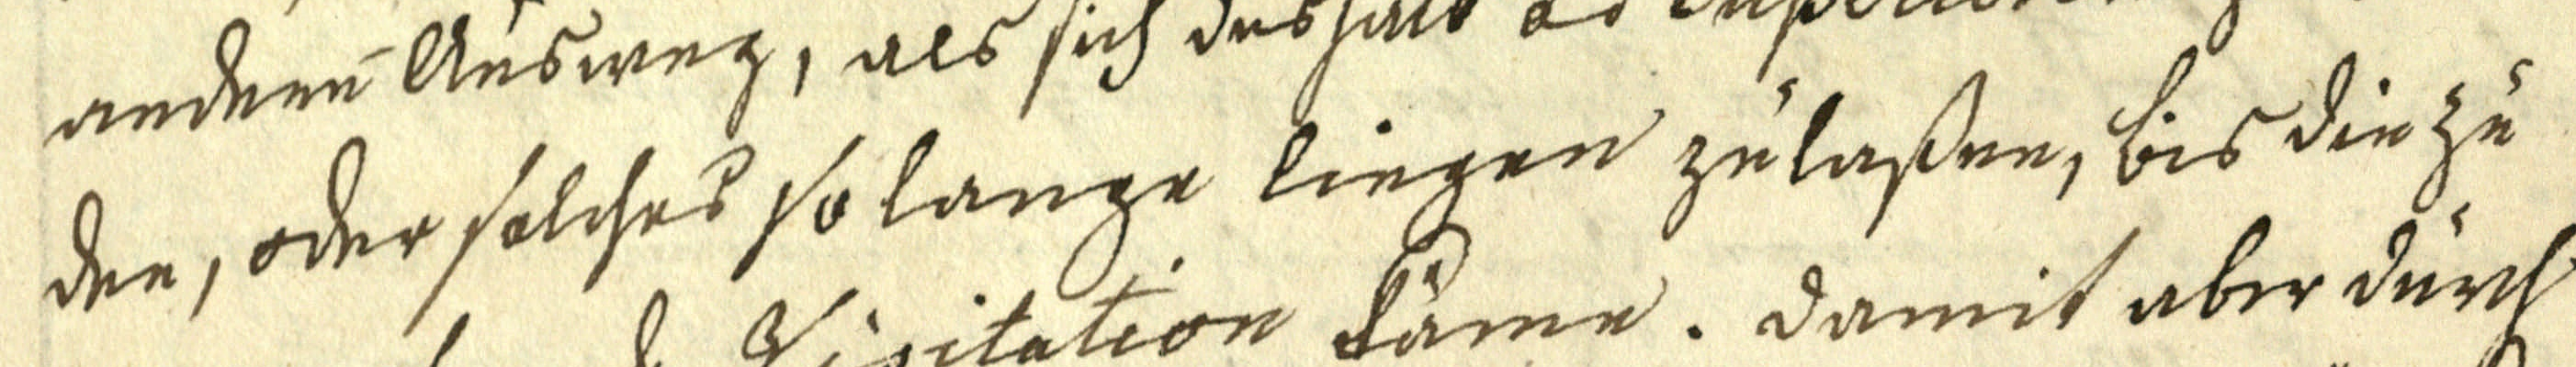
den, oder solches so lange liegen zulaßen, bis die zu
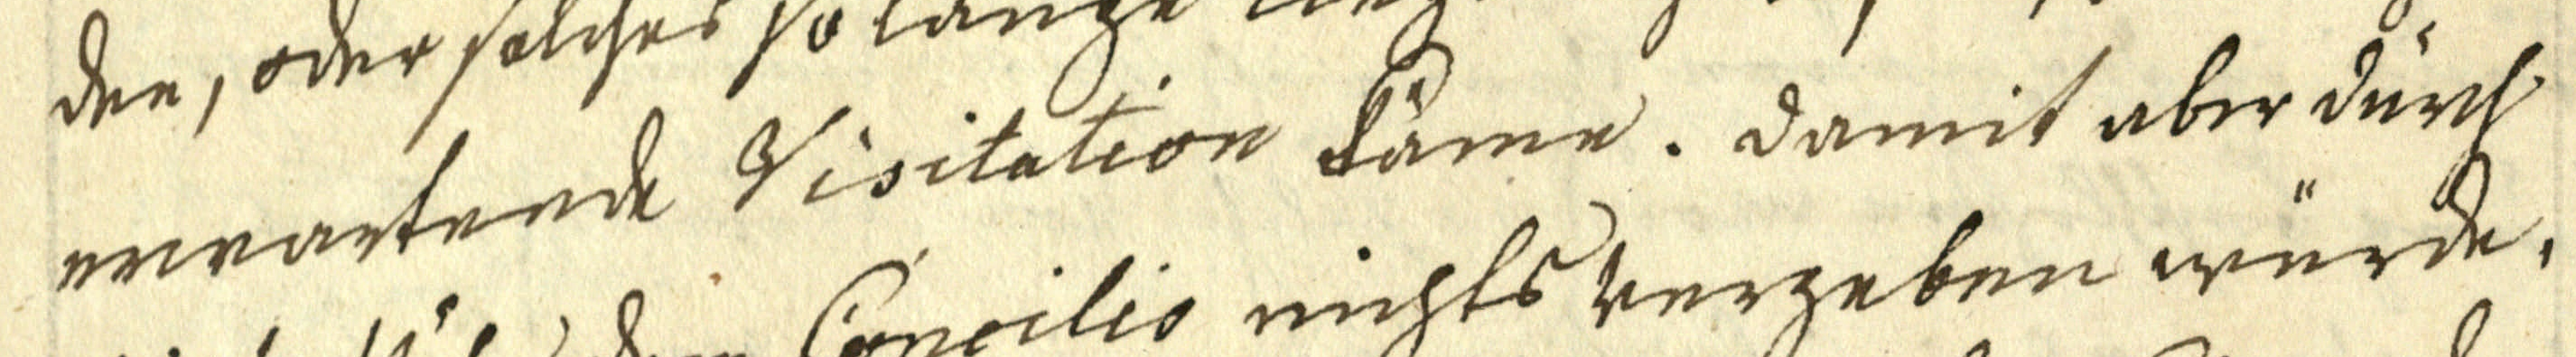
erwartende Visitation käme. Damit aber durch
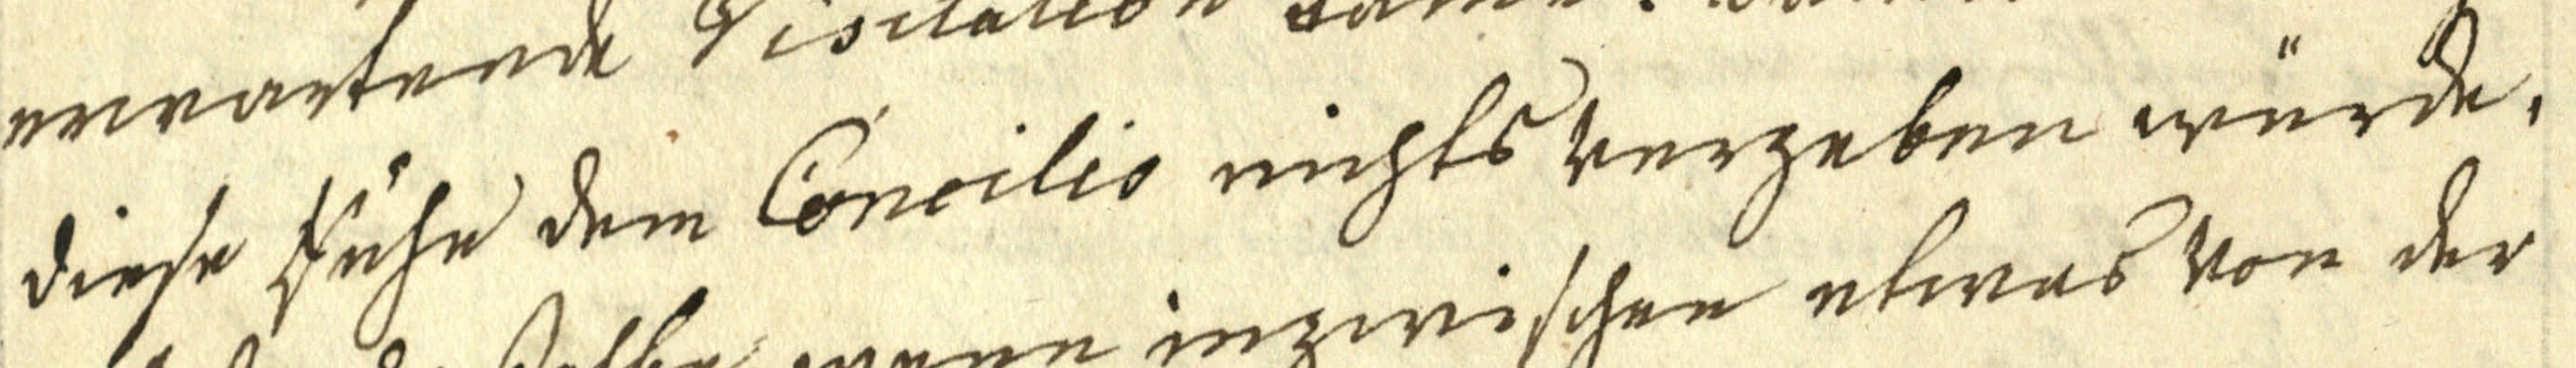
diese Ruhe dem Concilio nichts vergeben würde,
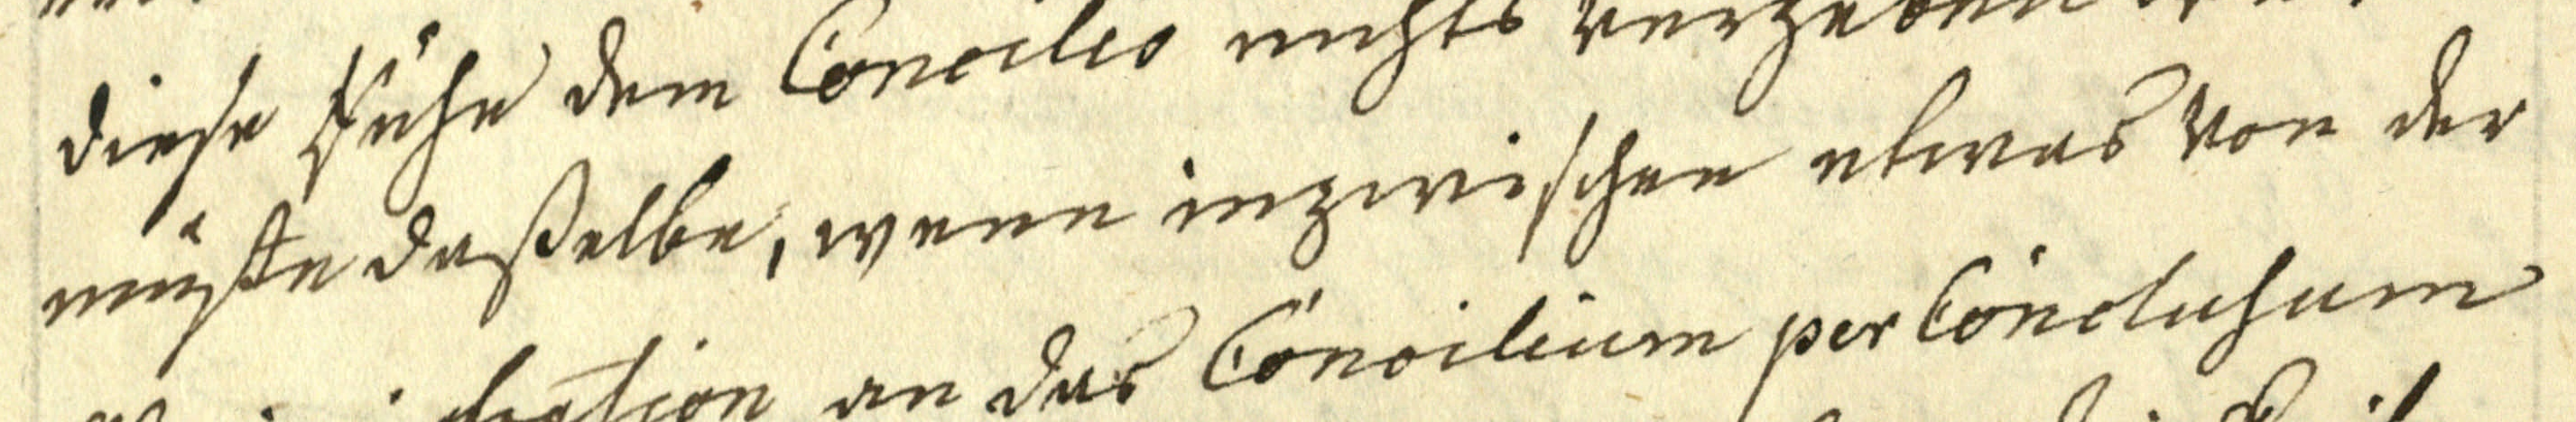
müßte daßelbe, wenn inzwischen etwas von der
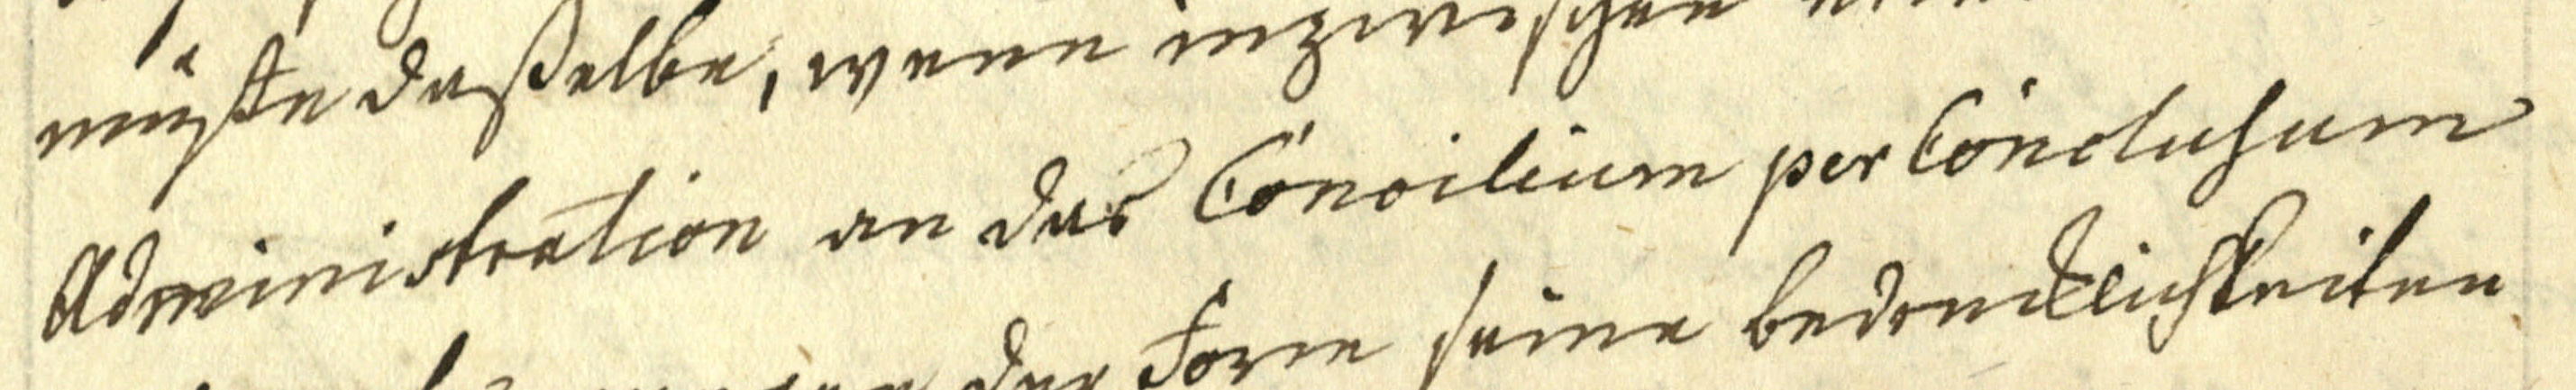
Administration an das Concilium per Conclusum
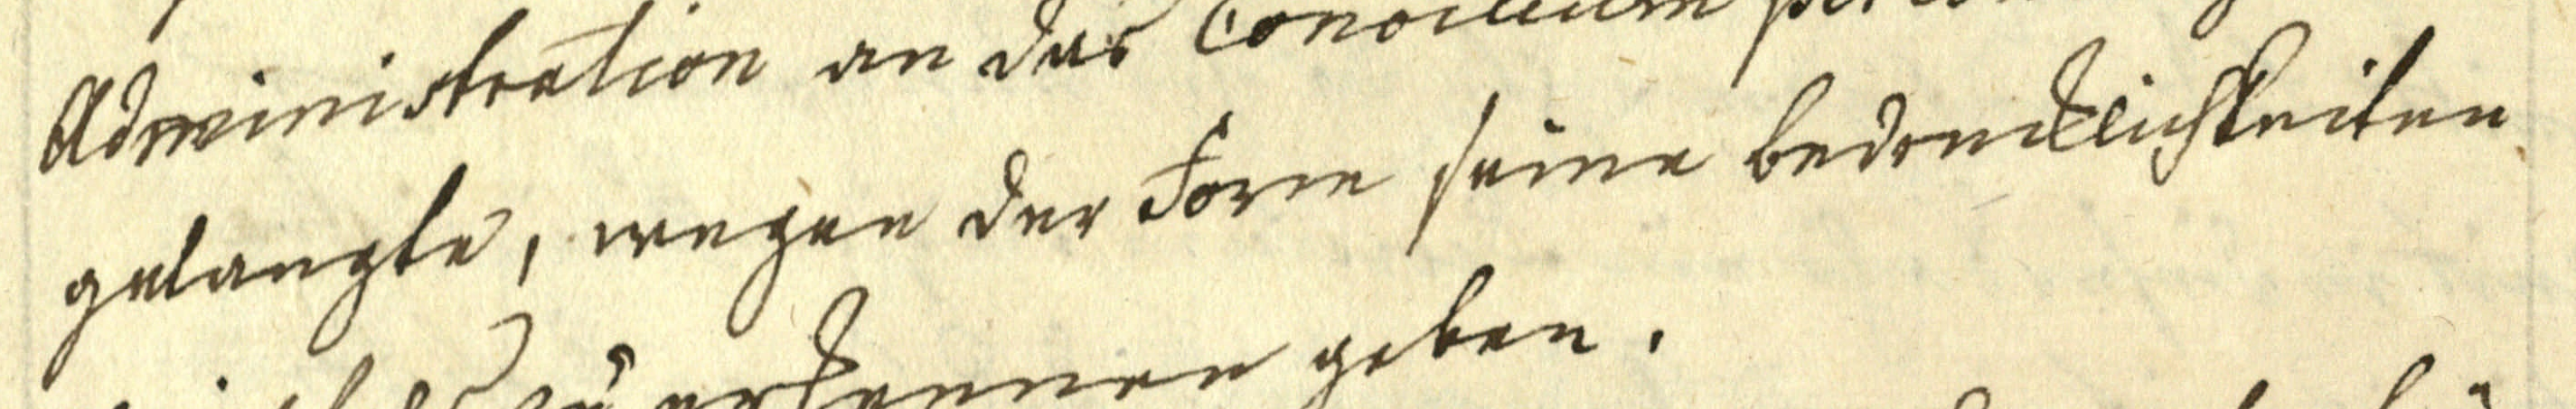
gelangte, wegen der Form seine Bedencklichkeiten
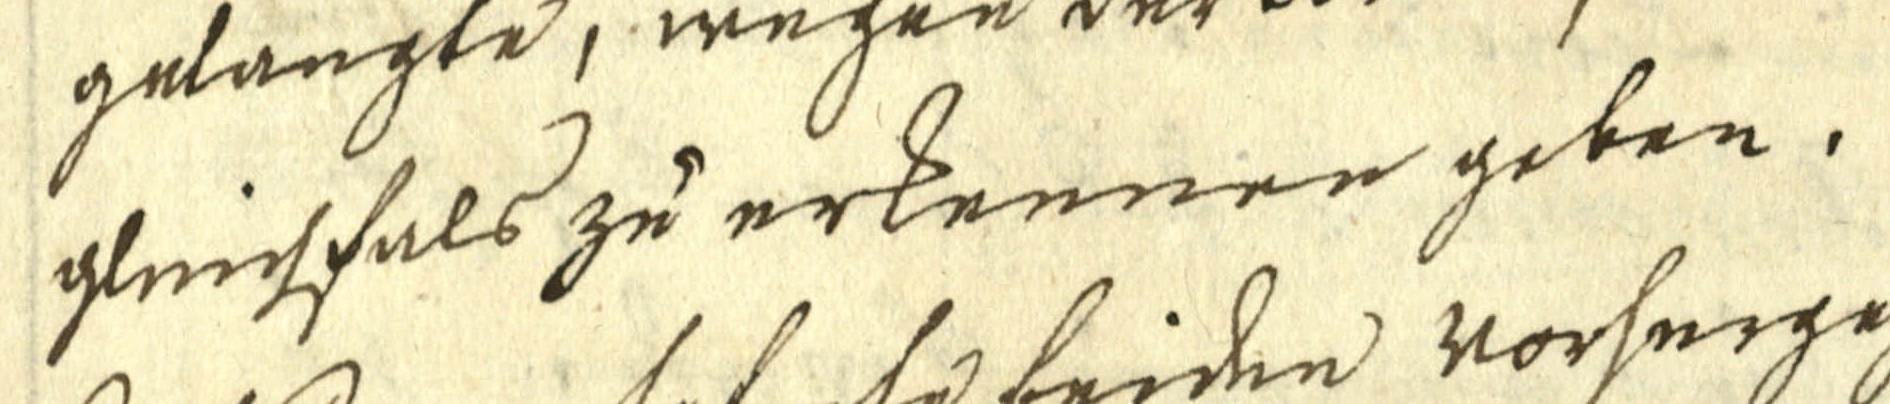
gleichfals zu erkennen geben.
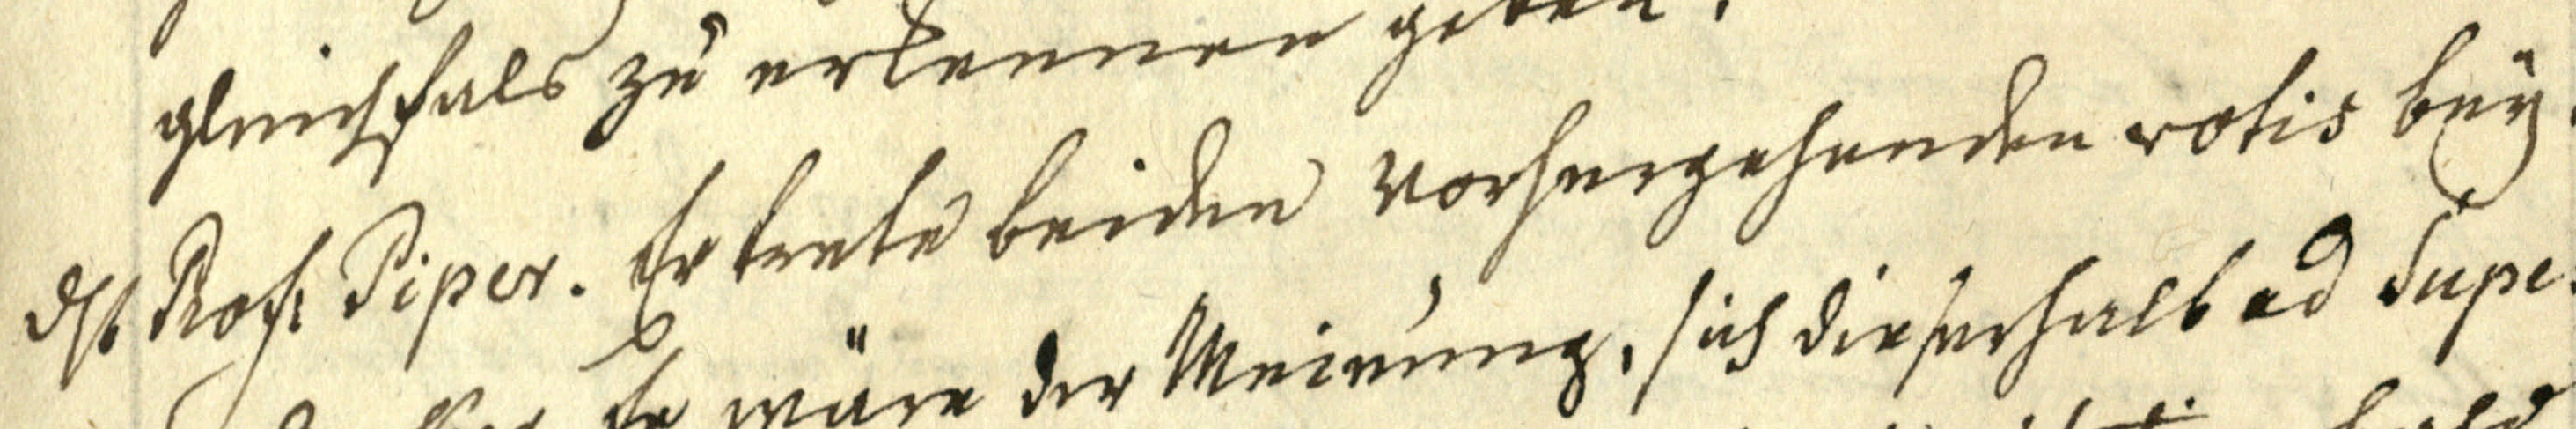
dh. Prof. Piper. Er trete beiden vorhergehenden votis beÿ.
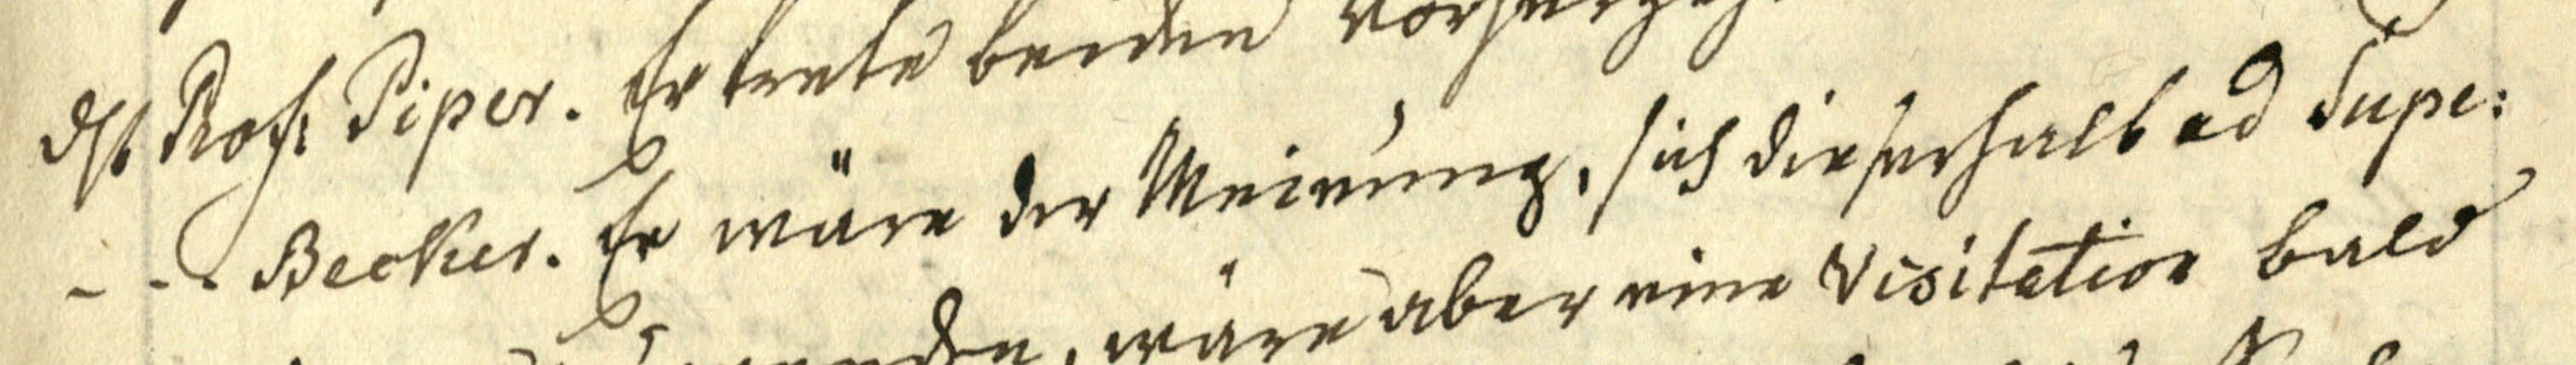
Becker. Er wäre der Meinung, sich dieserhalb ad Supe¬
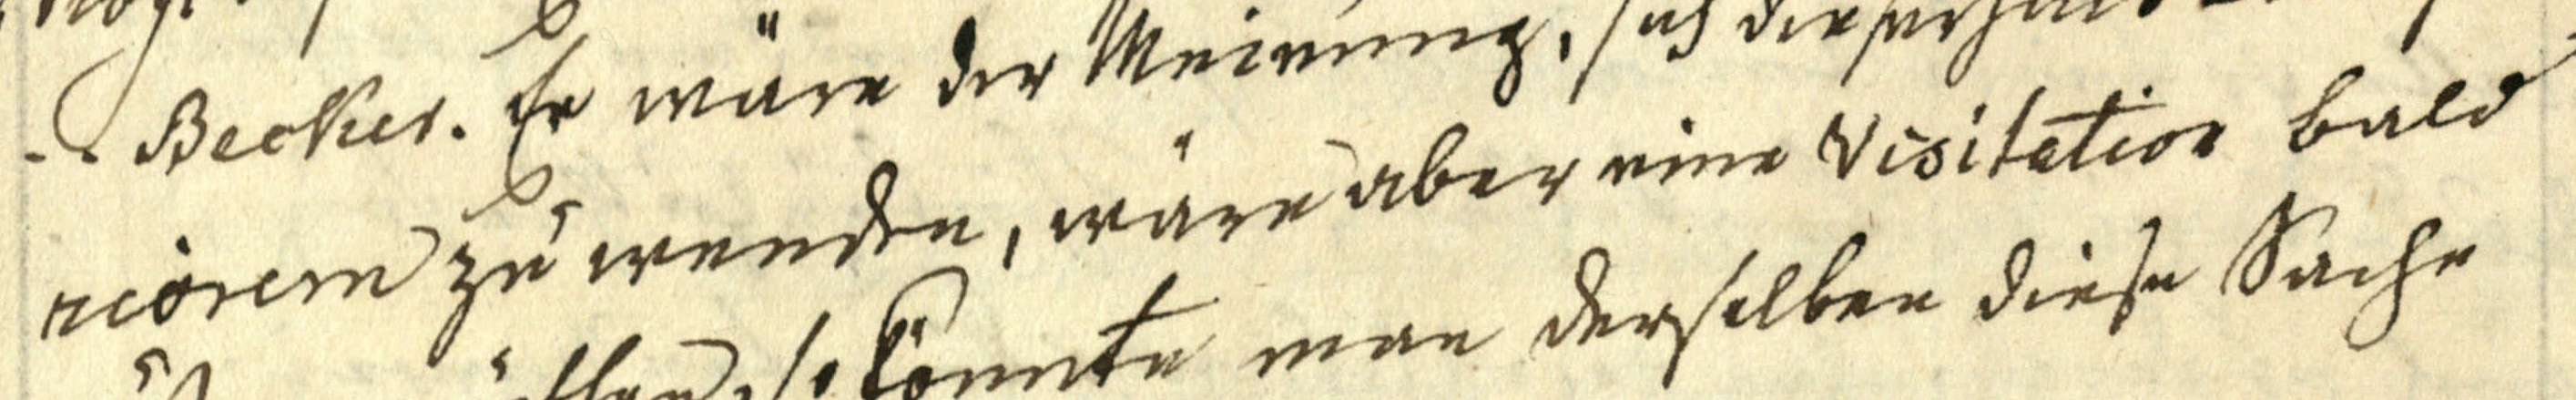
riorem zu wenden, wäre aber eine Visitation bald
